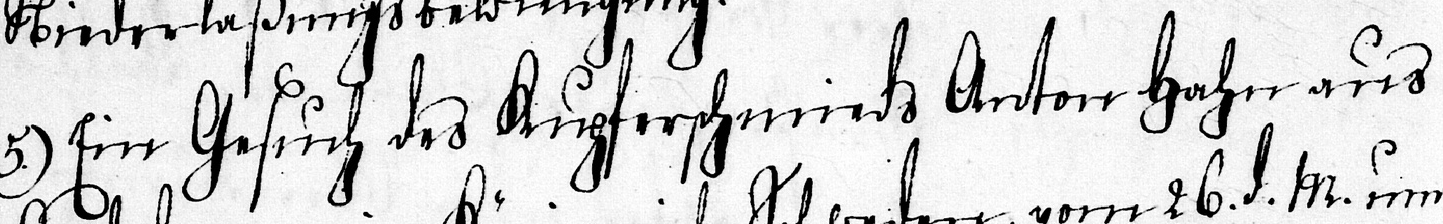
5.) Ein Gesuch des Kupferschmieds Anton Hahn aus
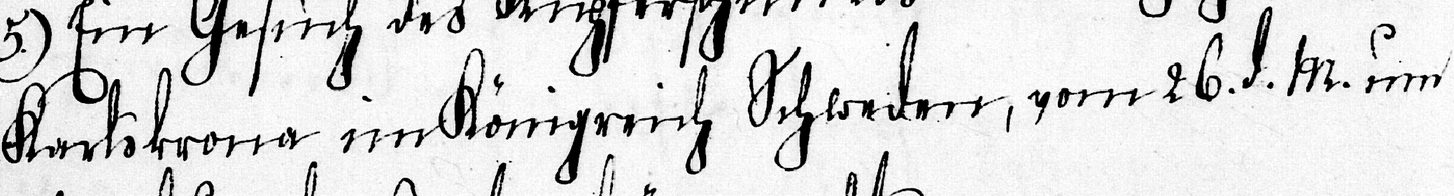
Karlskrona im Königreich Schweden, vom 26. d. M. um
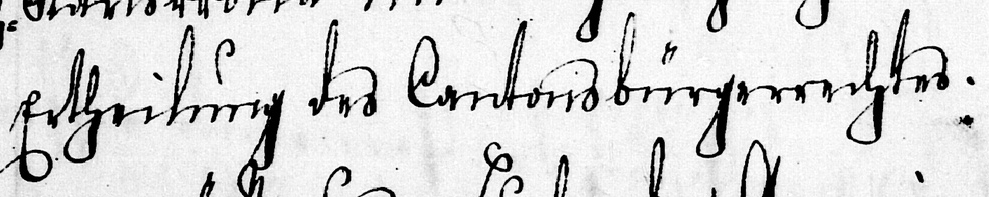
Ertheilung des Cantonsbürgerrechtes.
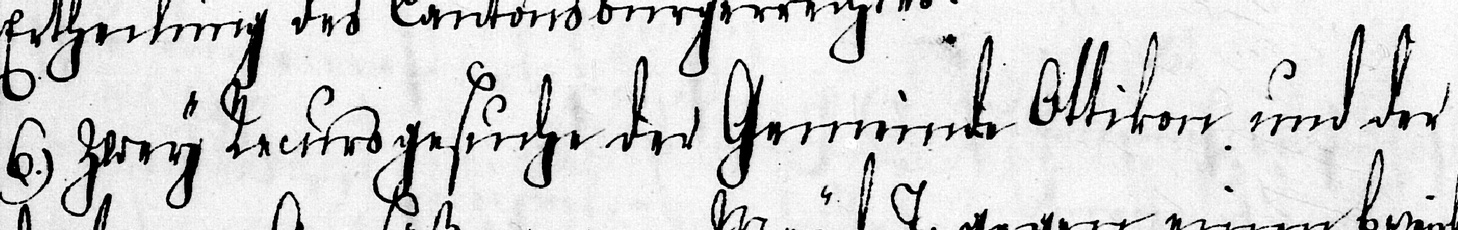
6.) Zwey Recursgesuche der Gemeinde Ottikon und der
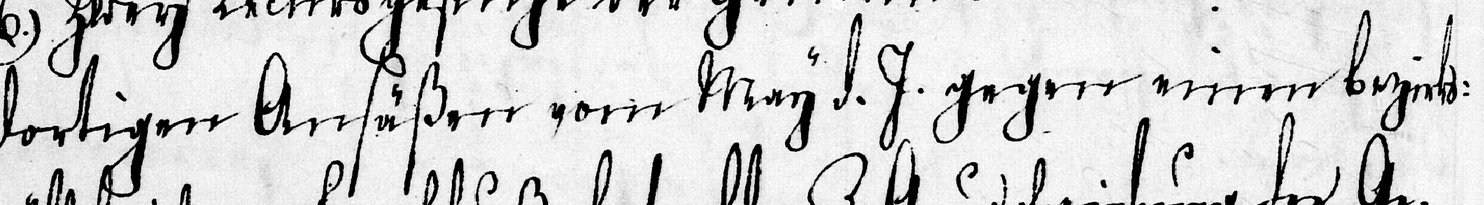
dortigen Ansäßen vom May d. J. gegen einen bezirks¬
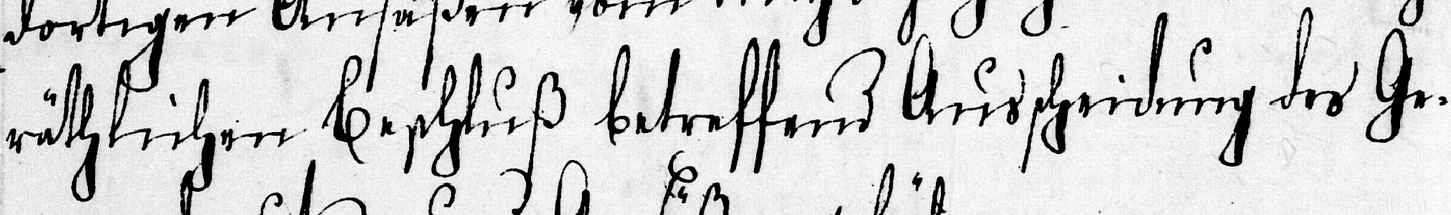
räthlichen Beschluß betreffend Ausscheidung des Ge¬
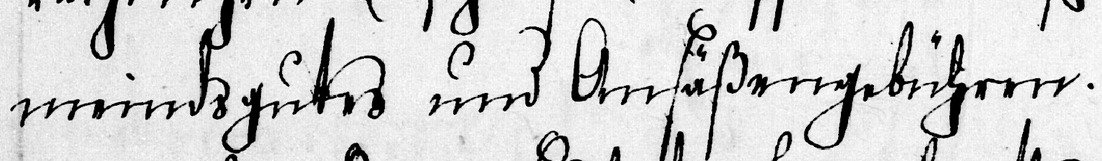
meindsgutes und Ansäßengebühren.
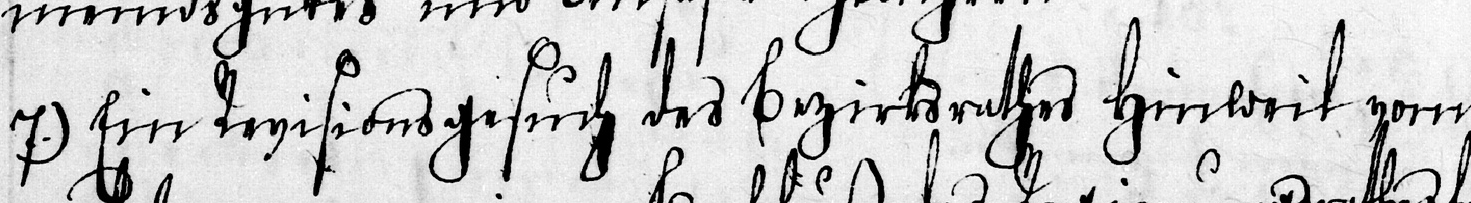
7.) Ein Revisionsgesuch des Bezirksrathes Hinweil vom
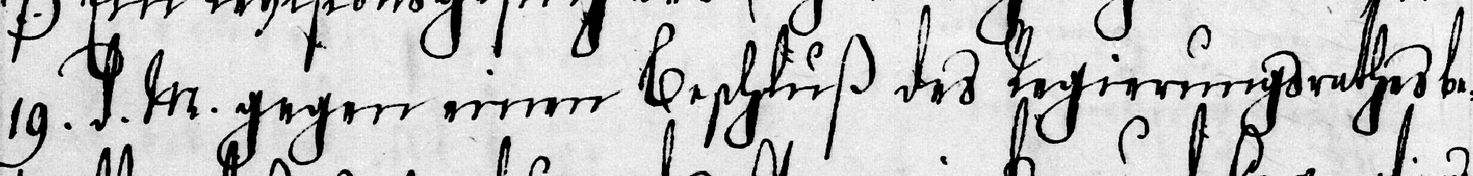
19. d. M. gegen einen Beschluß des Regierungsrathes b¬
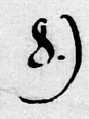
3.)
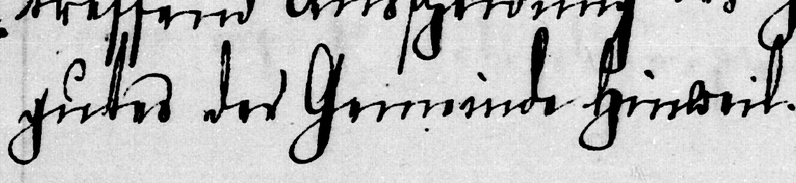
gutes der Gemeinde Hinweil.
